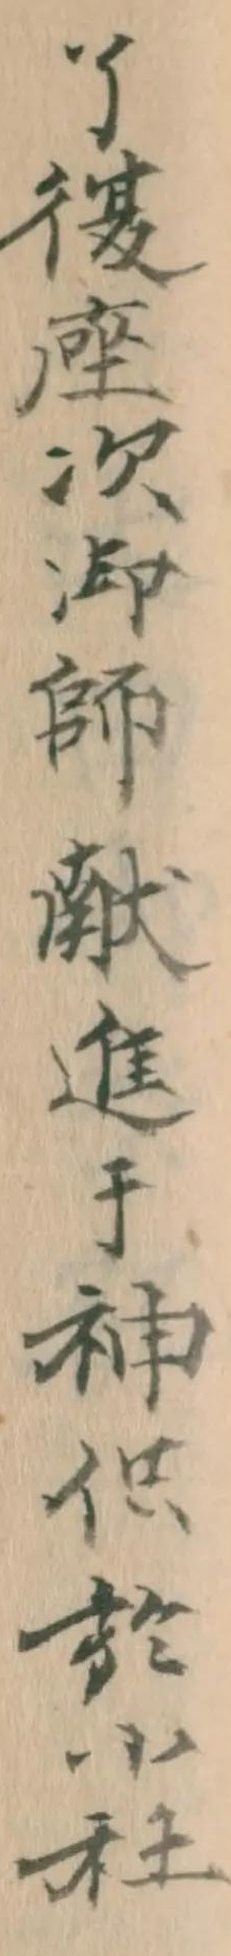了復座次御師献進于神供於小社

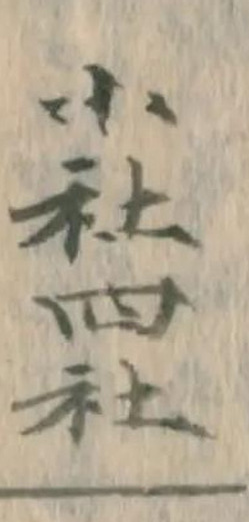小社四社
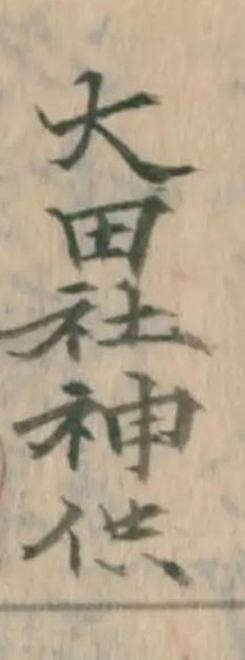大田社神供
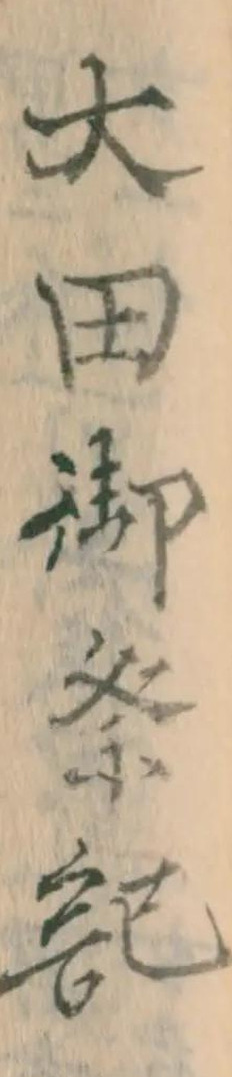大田御祭記
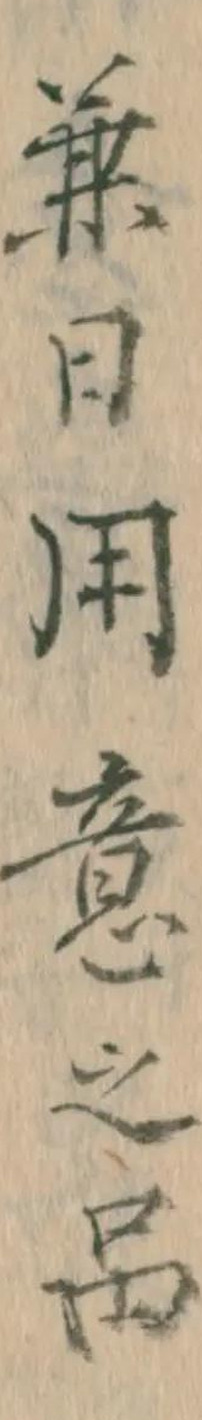兼日用意之品
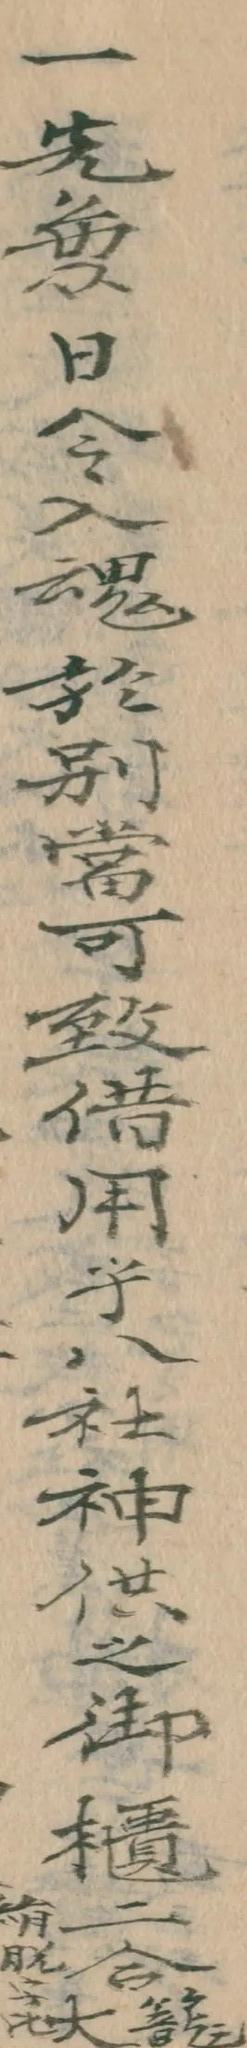一先兼日令入魂於別当可致借用子八社神供之御櫃二合籠大

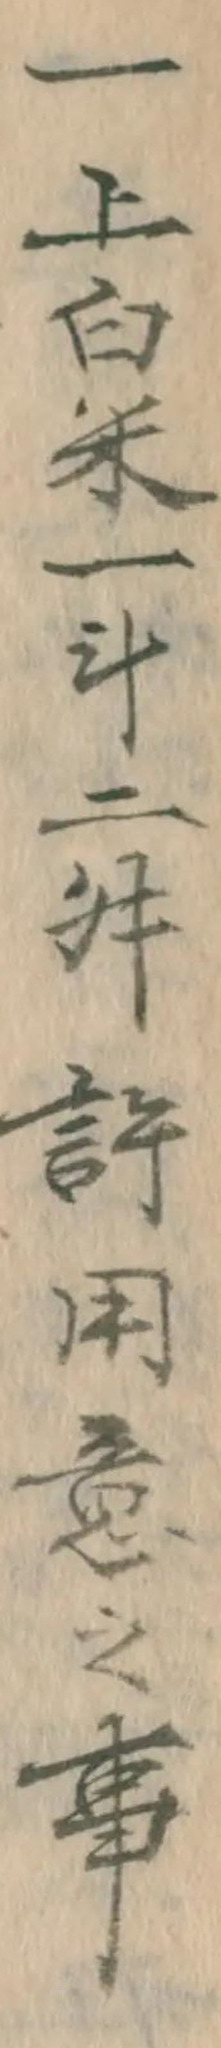一上白米一斗二升許用意之事
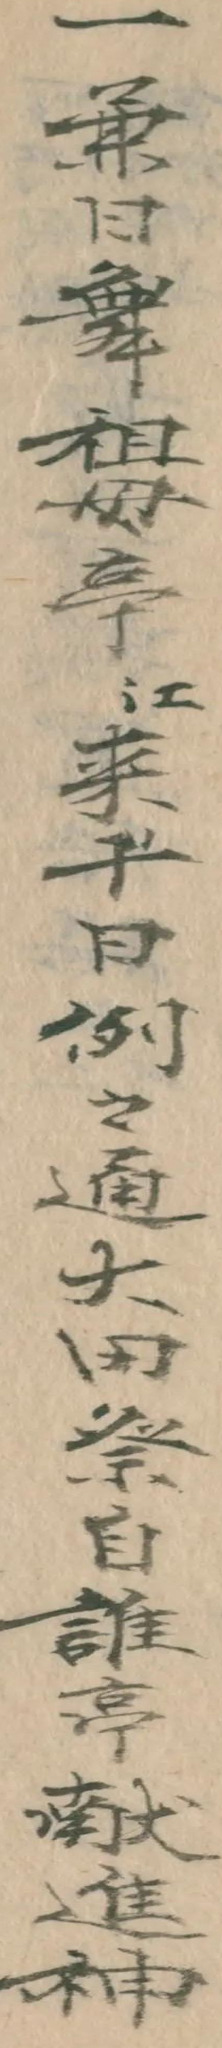一兼日舞祖母亭江来十日例之通大田祭自誰亭献進神
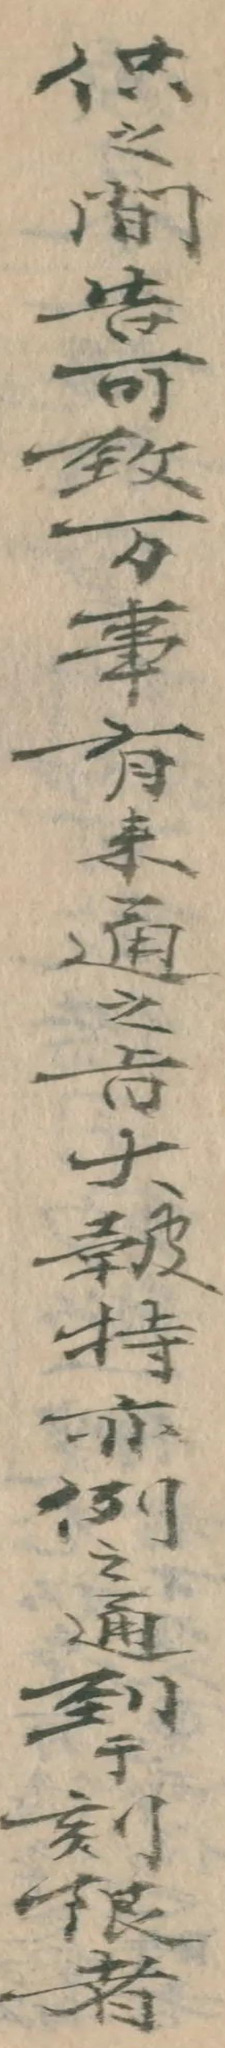供之間告可致万事有来通之旨大鼓持亦例之通到于刻限者
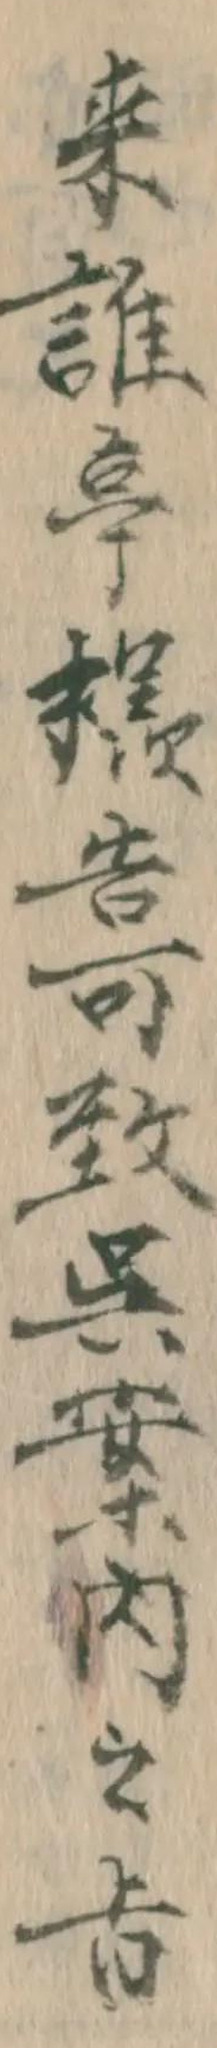来誰亭様告可致呉案内之旨
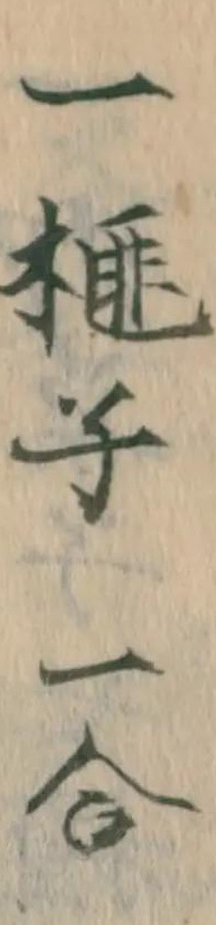一榧子一合
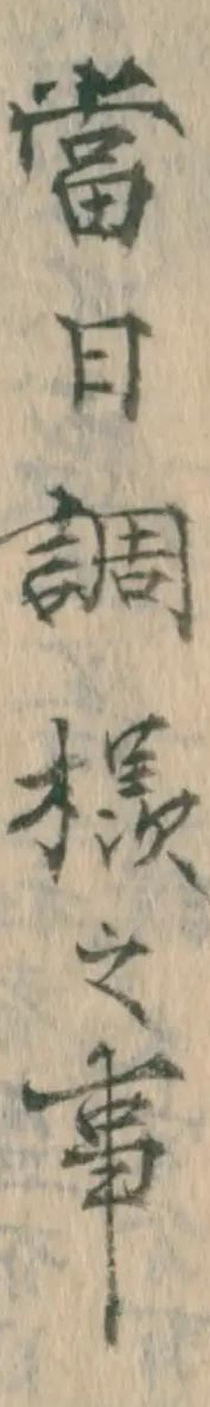当日調様之事
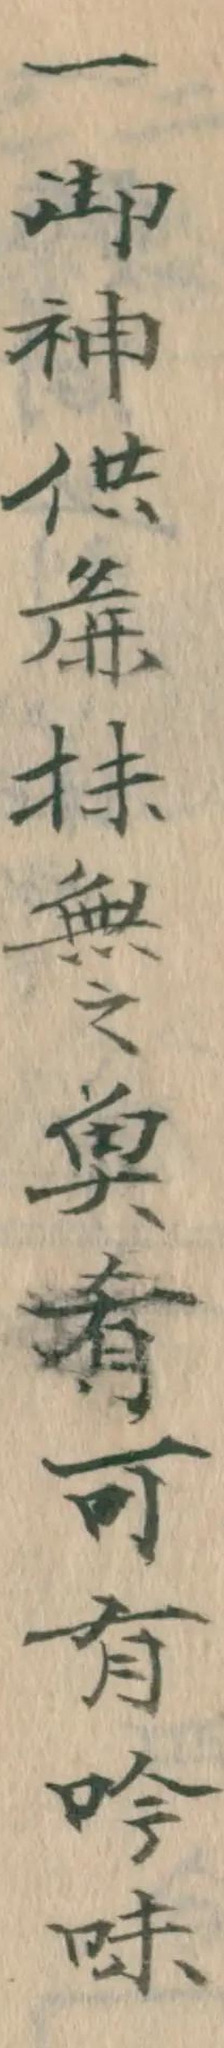一御神供麁抹無之魚肴可有吟味
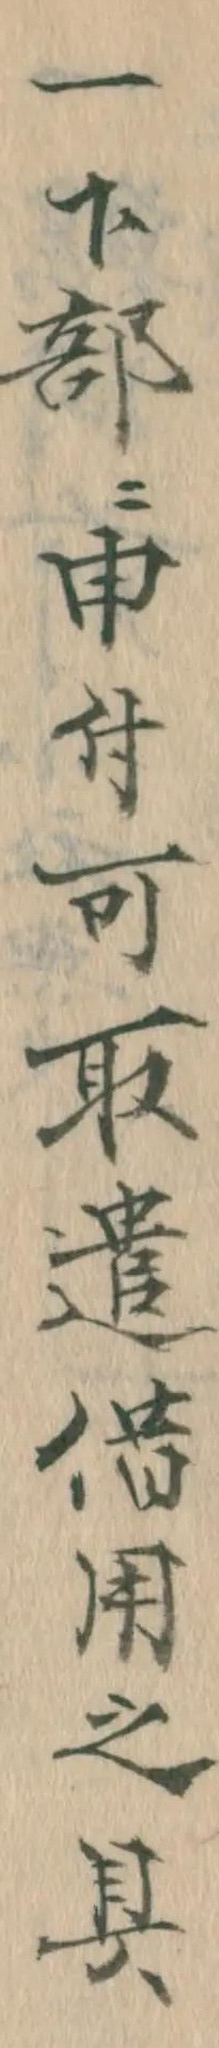一下部ニ申付可取遣借用之具

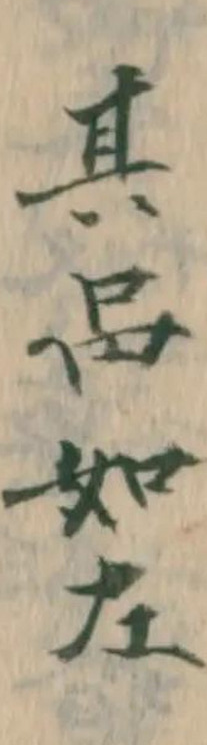其品如左
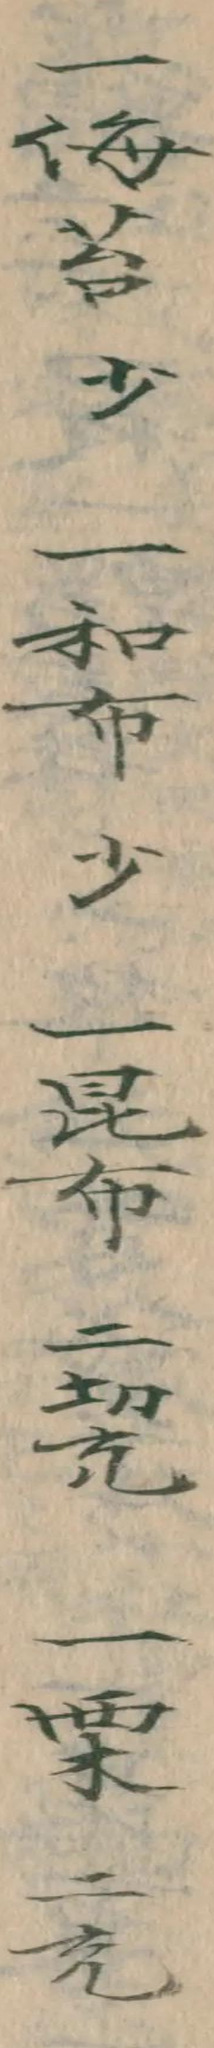一海苔少一和布少一昆布二切充一栗二充
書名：賀茂社記録. 第9冊
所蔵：国立国会図書館 National Diet Library, JAPAN
